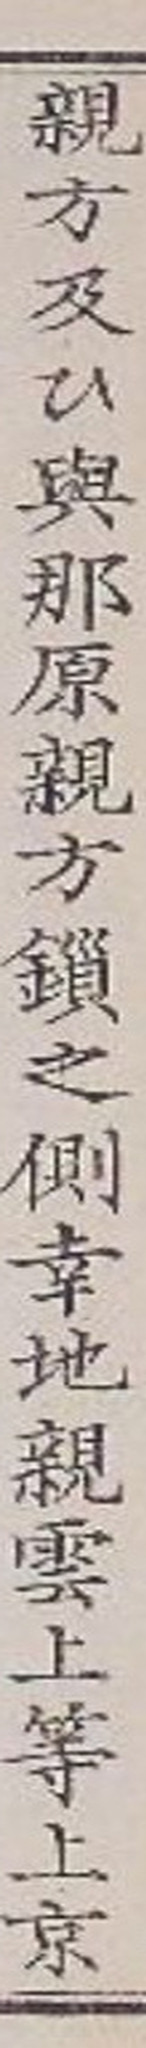親方及ひ与那原親方鎖之側幸地親雲上等上京
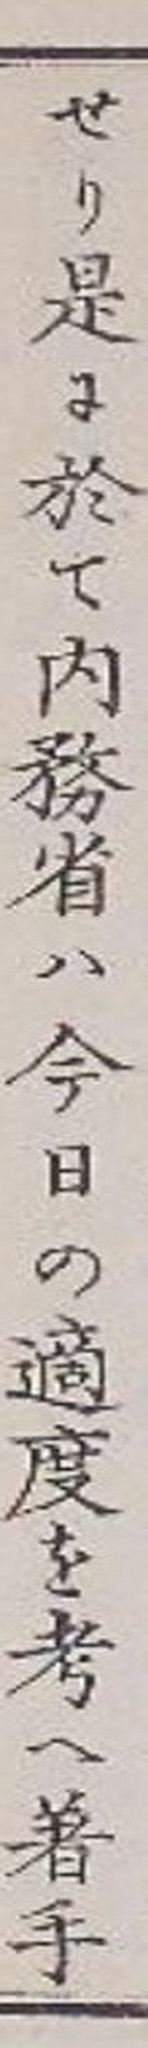せり是に於て内務省は今日の適度を考え着手
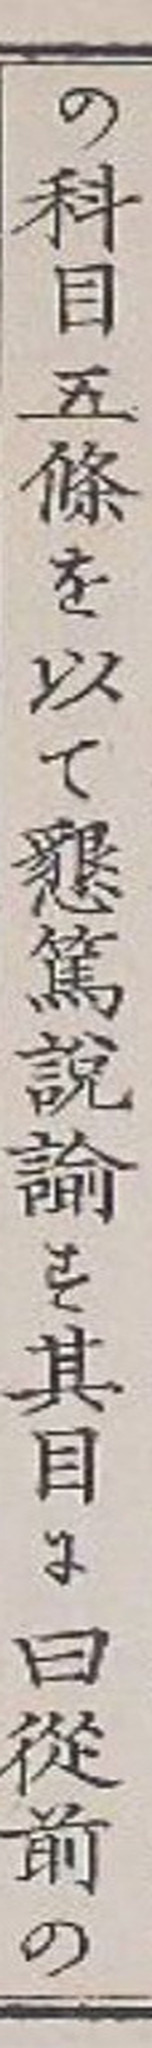の科目五条を以て懇篤説諭す其目に曰従前の
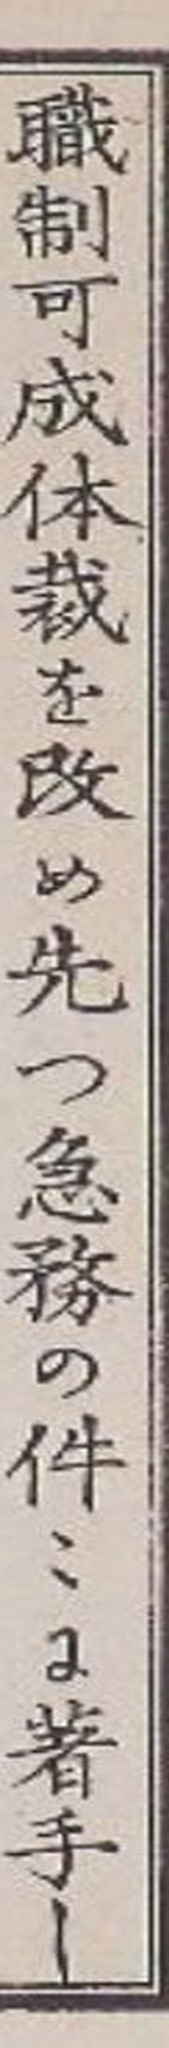職制可成体裁を改め先つ急務の件々に着手し
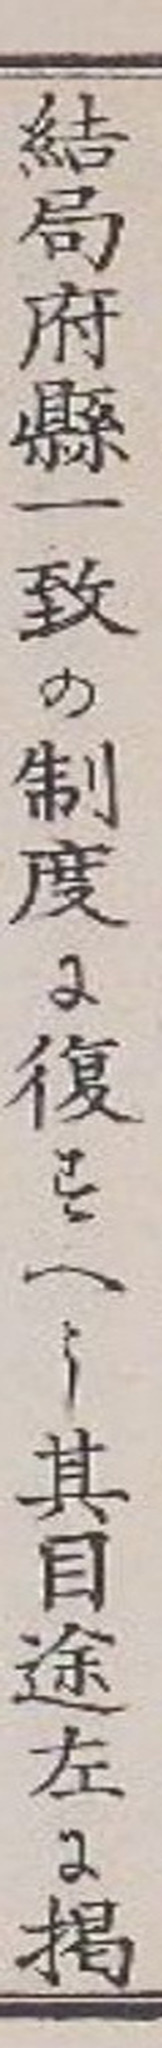結局府県一致の制度に復すへし其目途左に掲
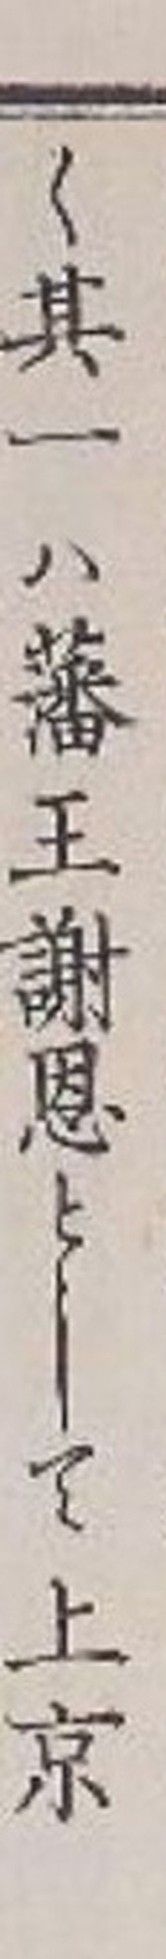く其一は藩王謝意として上京
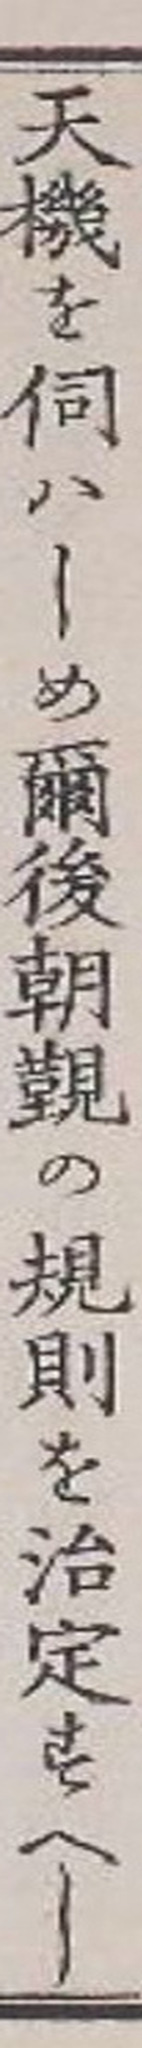天機を伺はしめ爾後朝覲の規則を治定すへし
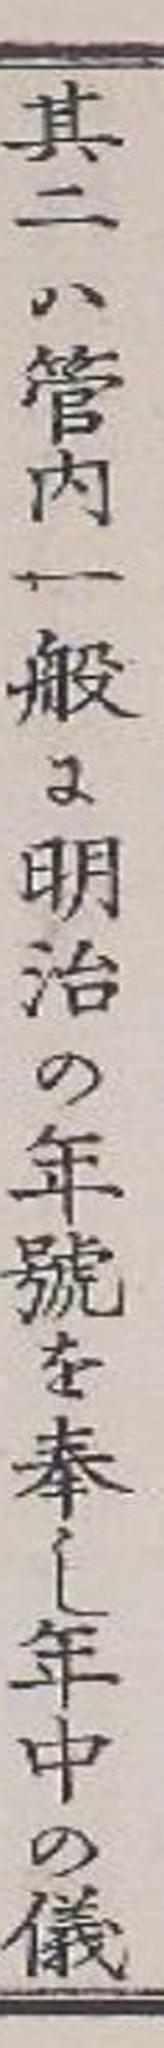其二は管内一般に明治の年号を奉し年中の儀
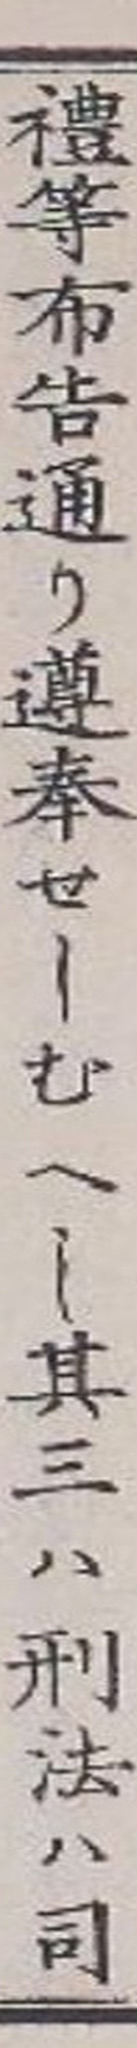礼等布告通り遵奉せしむへし其三は刑法は司
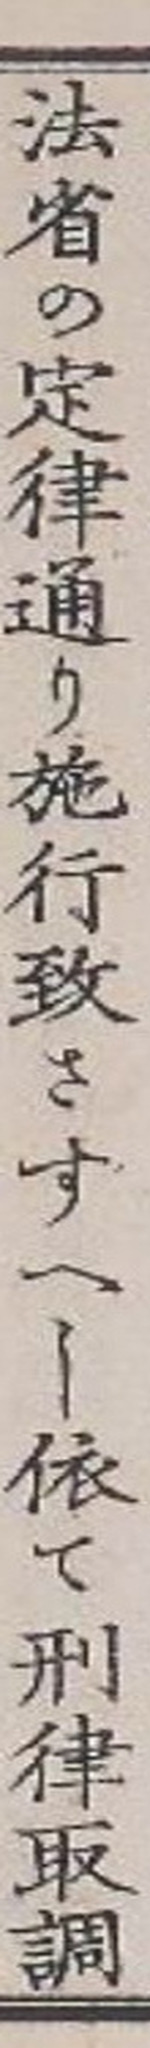法省の定律通り施行致さすへし依て刑律取調
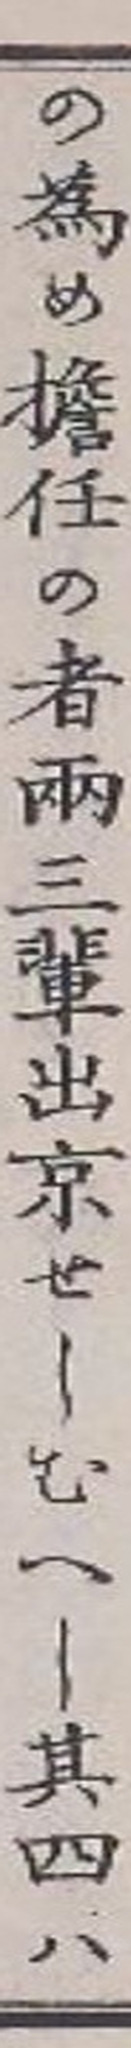の為め担人の者両三輩出京せしむへし其四は
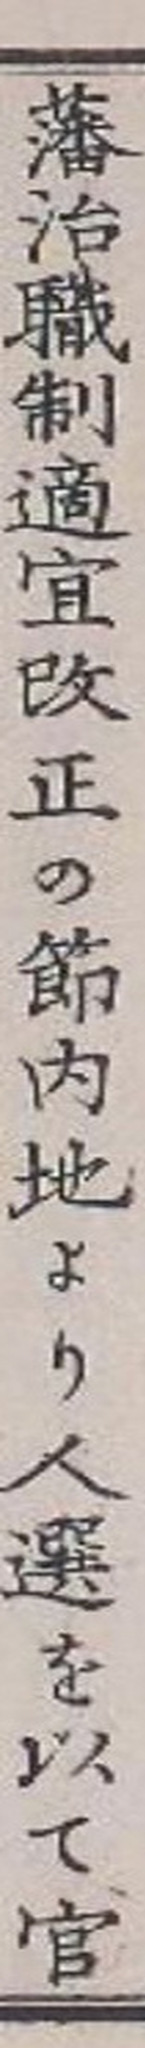藩治職制適宜改正の節内地より人選を以て官
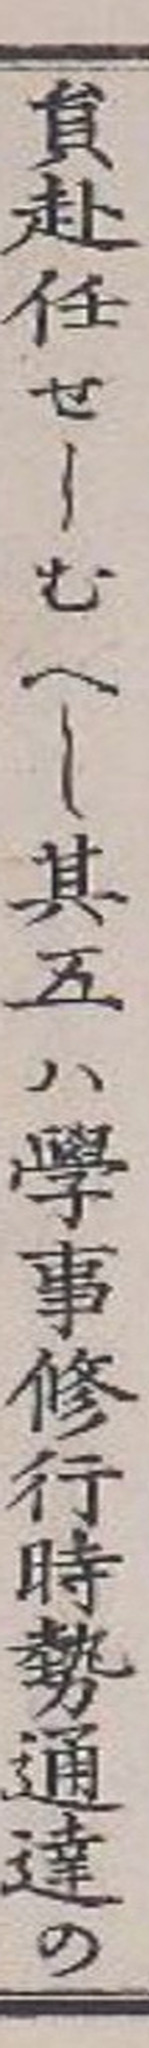員赴任せしむへし其五は学事修行時勢通達の

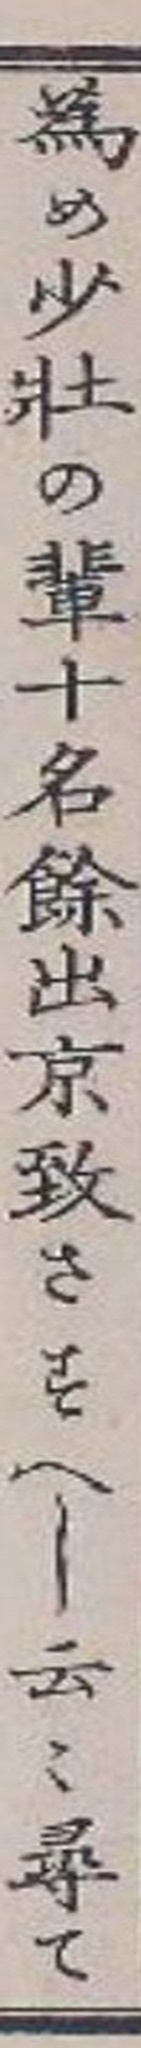為め少壮の輩十名余出京致さすへし云々尋て
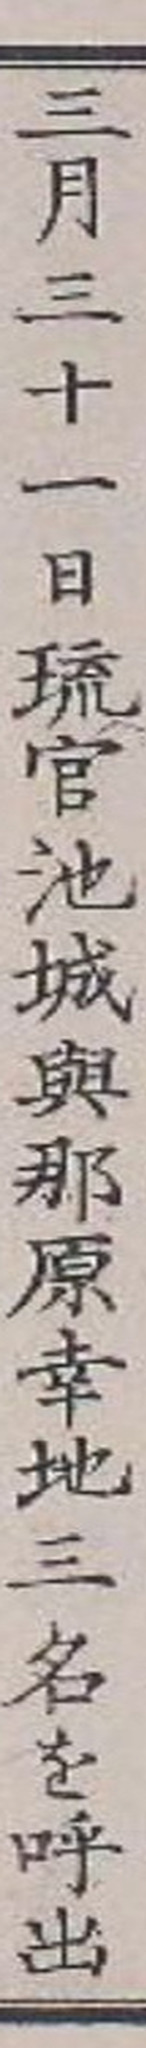三月三十一日琉官池城与那原幸地三名を呼出
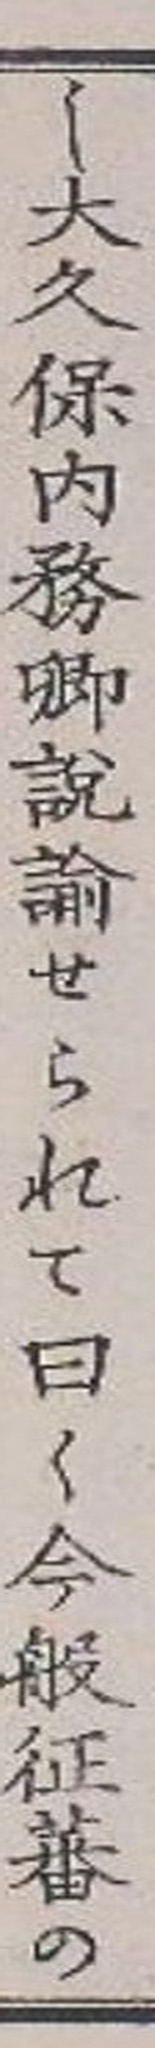し大久保内務卿説諭せられて曰く今般征蕃の
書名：南島紀事 下
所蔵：University of the Ryukyus Library
